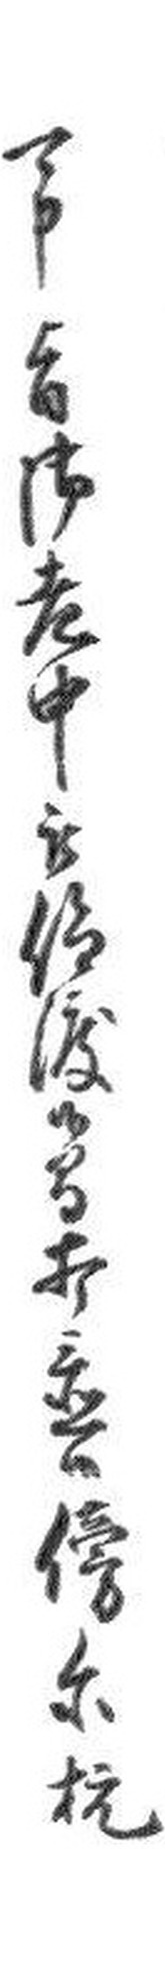可申旨御老中被仰渡候間打置候傍尓杭
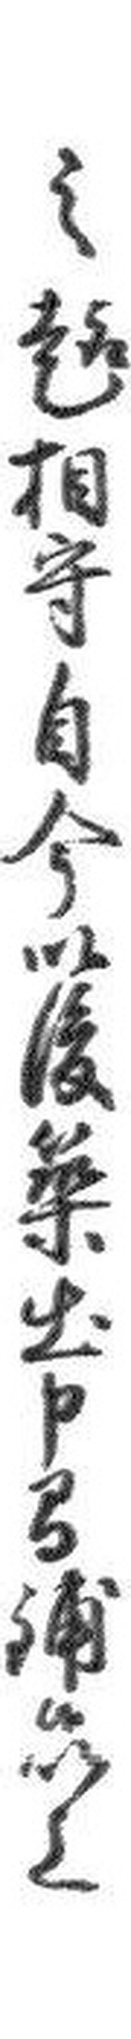之趣相守自今以後築出申間舖候以上
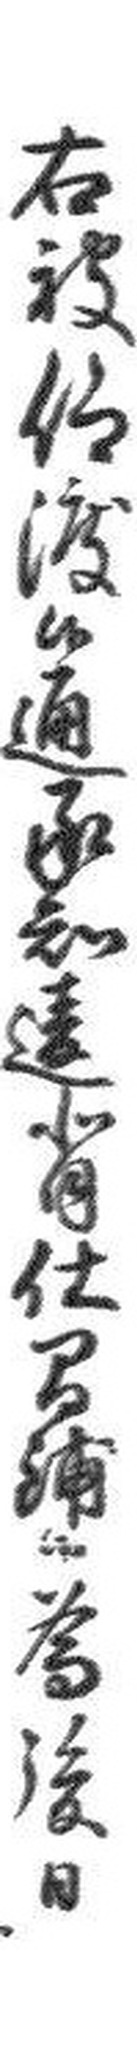右被仰渡候通承知違背仕間舖候為後日
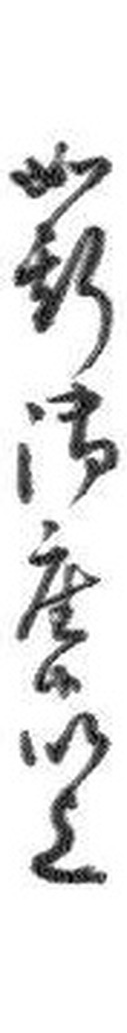如斯御座候以上
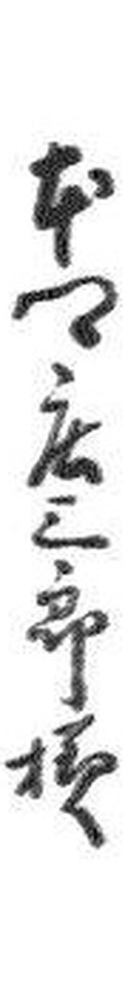本郷庄三郎様
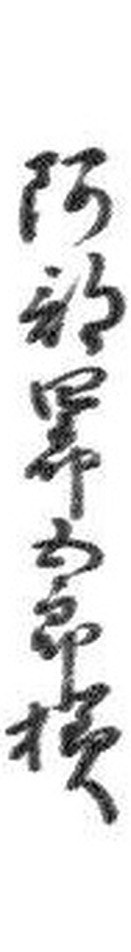阿部四郎五郎様
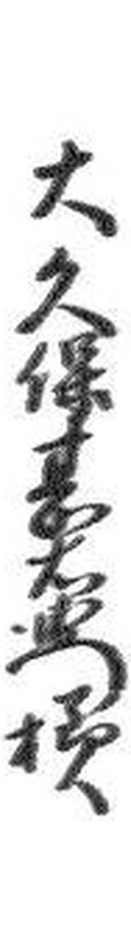大久保甚右衛門様
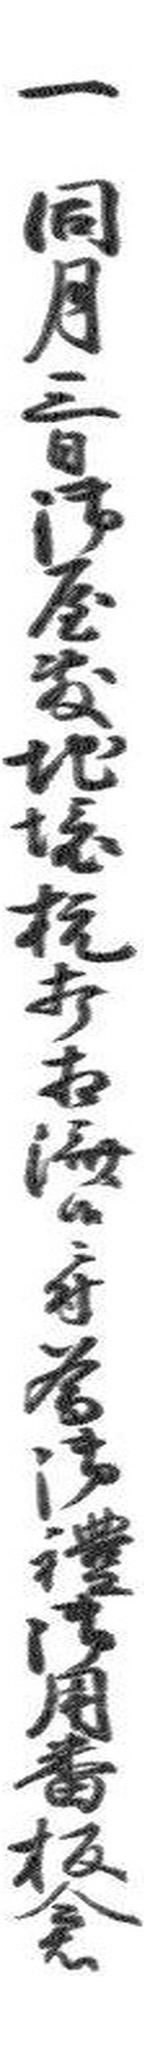一同月三日御屋敷地境杭打相済候ニ付為御礼御用番板倉

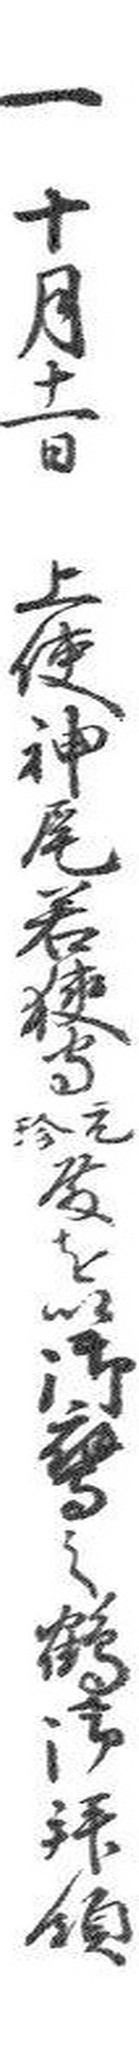一十月十一日上使神尾若狭守元珍殿を以御鷹之鶴御拝領
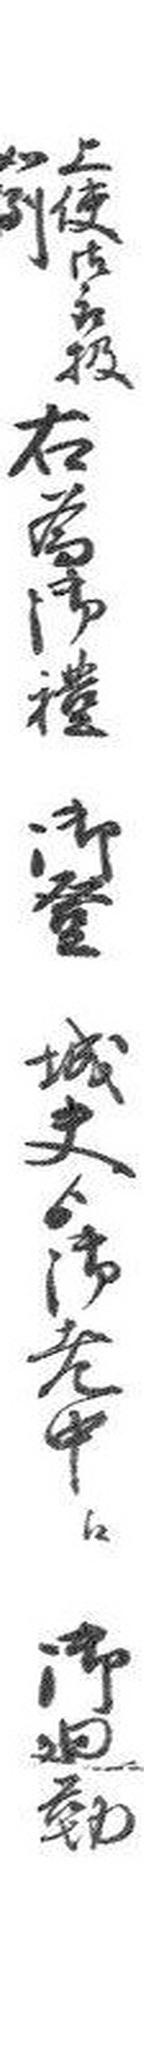上使御取扱如例右為御礼御登城夫ゟ御老中江御廻勤
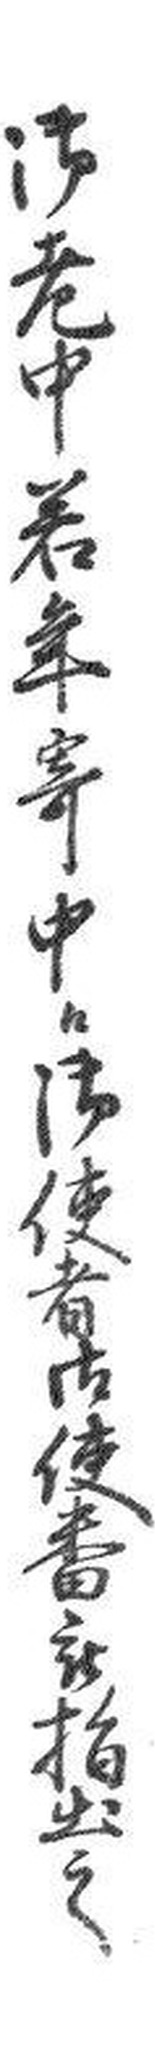御老中若年寄中江御使者御使番被指出之
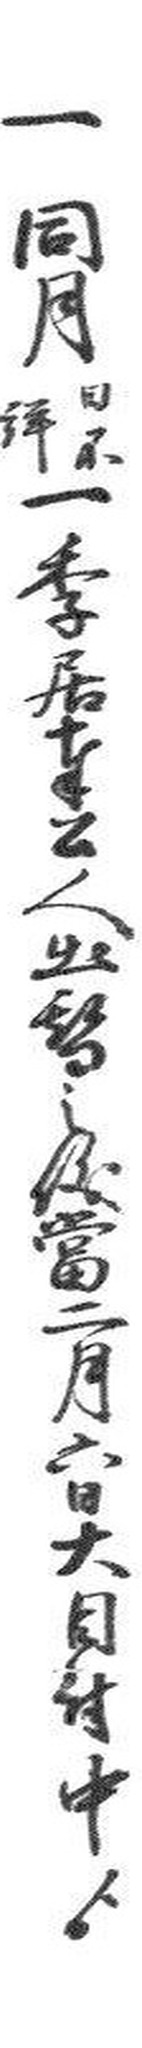一同月日不詳一季居奉公人出替之儀当二月六日大目付中ゟ
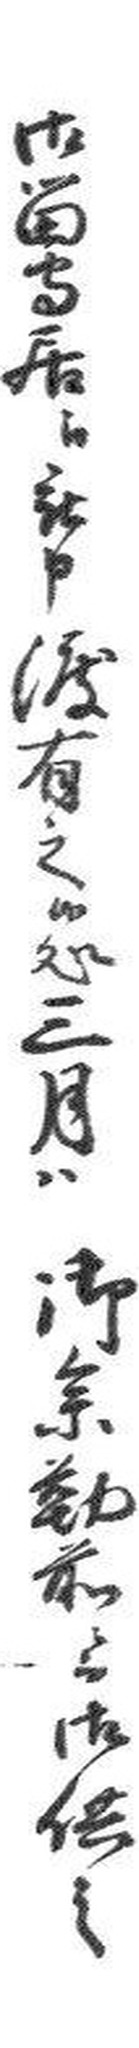御留守居江被申渡有之候処三月は御参勤前ニ而御供之
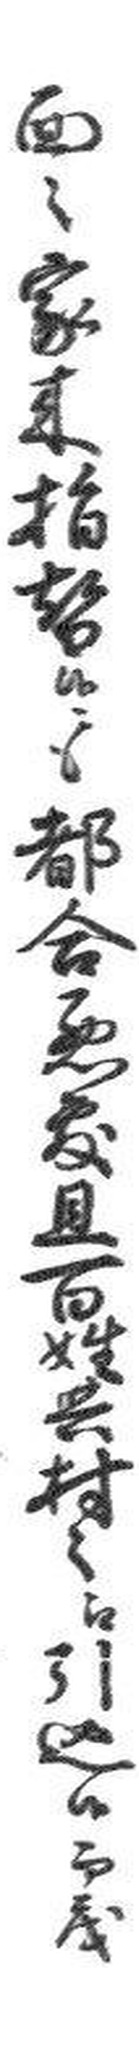面々家来指替候ニも都合悪敷且百姓共村々江引込候而も
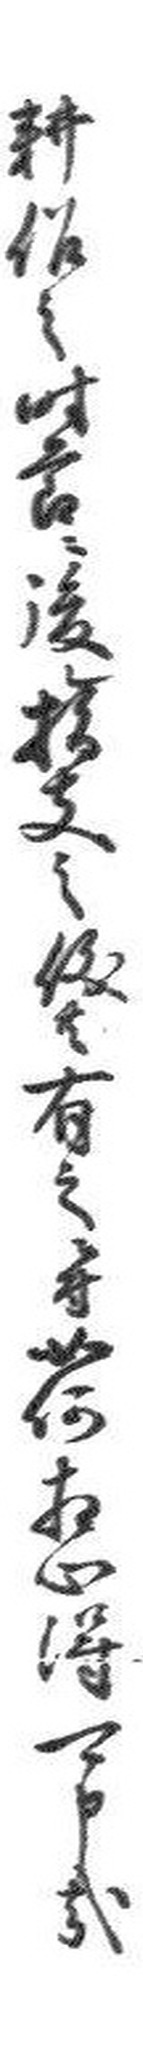耕作之時節ニ後レ指支之儀共有之ニ付如何相心得可申哉
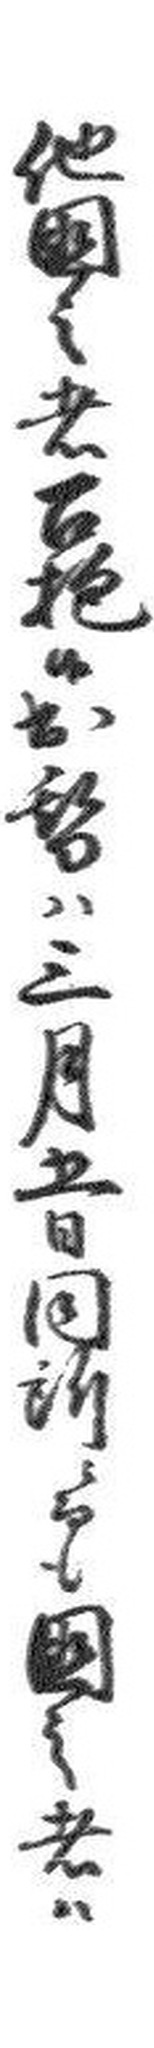他国之者召抱候出替は三月五日同所ニ而も国之者は
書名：家譜 八 光通公 従寛文十年到同十二年
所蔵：福井県文書館 Fukui Prefectural Archives
